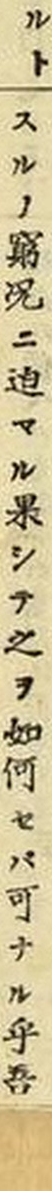スルノ窮况ニ迫マル果シテ之ヲ如何セバ可ナル乎吾
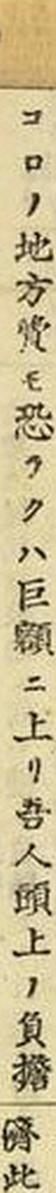コロノ地方費モ恐ラクハ巨額ニ上リ吾人頭上ノ負擔
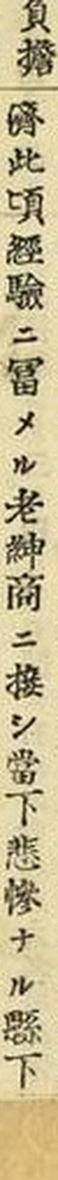儕此頃經驗ニ冨メル老紳商ニ接シ當下悲惨ナル縣下
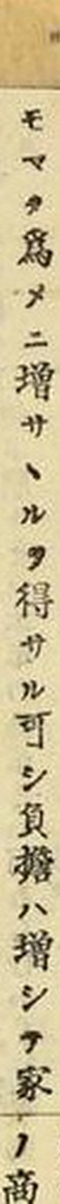モマタ爲メニ増サヽルヲ得サル可シ負擔ハ増シテ家
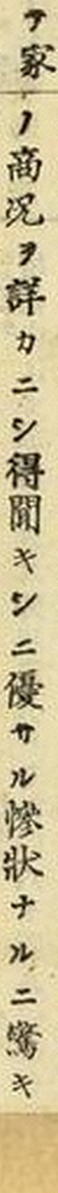ノ商况ヲ詳カニシ得聞キシニ優サル慘狀ナルニ驚キ
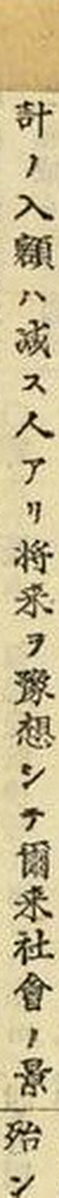計ノ入額ハ減ス人アリ将来ヲ豫想シテ爾来社會ノ景
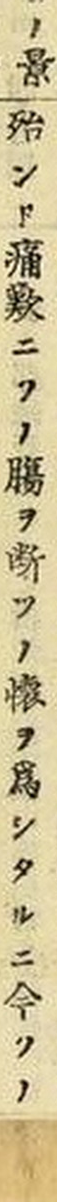殆ンド痛歎ニソノ膓ヲ断ツノ懐ヲ爲シタルニ今ソノ
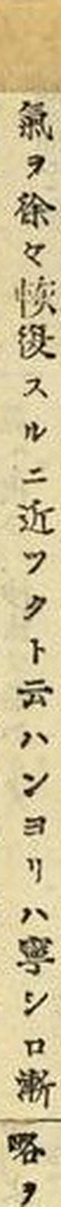氣ヲ徐々恢復スルニ近ツクト云ハンヨリハ寧シロ漸
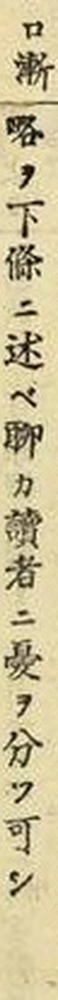略ヲ下條ニ述ベ聊カ讀者ニ憂ヲ分ツ可シ
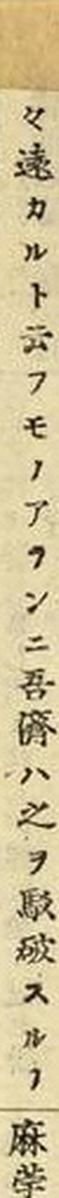々遠カルト云フモノアランニ吾濟ハ之ヲ駁破スルノ
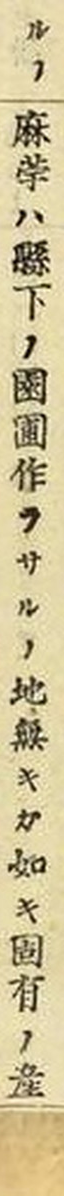麻荢ハ縣下ノ園圃作ラサルノ地無キガ如キ固有ノ産
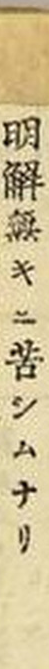明解無キニ苦シムナリ
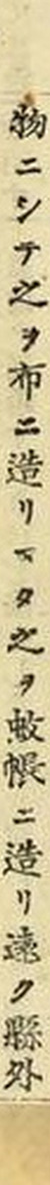物ニシテ之ヲ布ニ造リマタ之ヲ蚊帳ニ造リ遠ク縣外
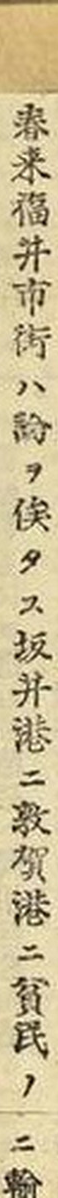春来福井市街ハ論ヲ俟タス坂井港ニ敦賀港ニ貧民ノ
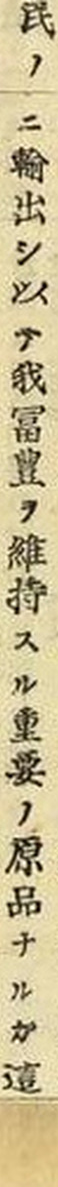ニ輸出シ以テ我冨豊ヲ維持スル重要ノ原品ナルガ這
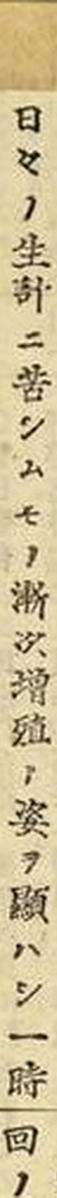日々ノ生計ニ苦シムモノ漸次増殖ノ姿顯ハシ一時
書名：温古集 五巻
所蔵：福井県文書館 Fukui Prefectural Archives
